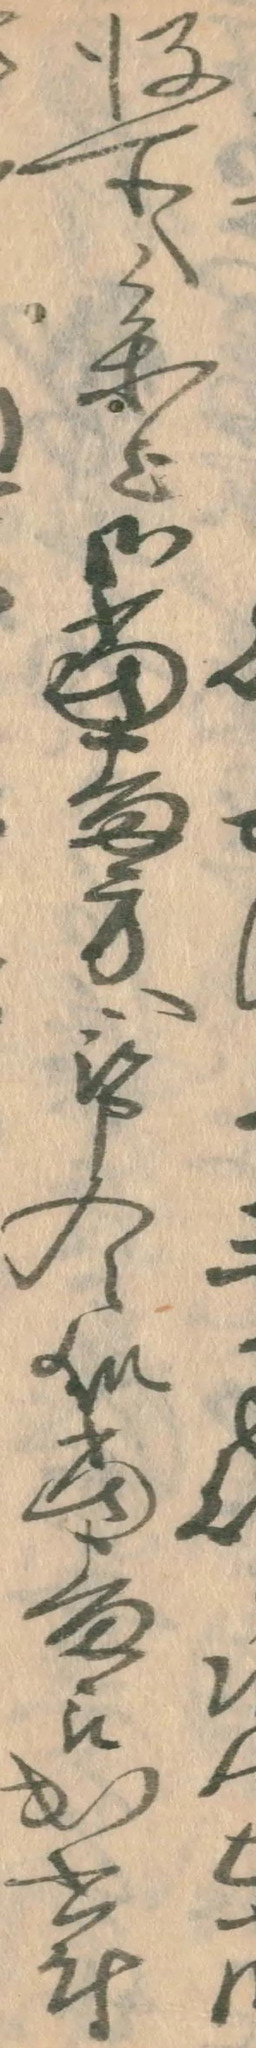役所へ参上御当番方へ被申入候処当番被出書付
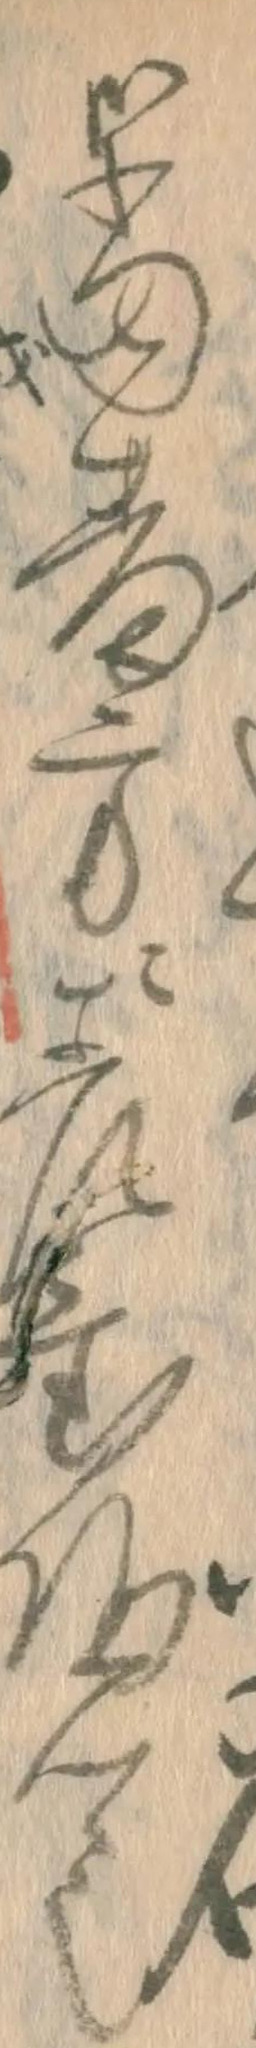御当番方ニ差置帰郷也
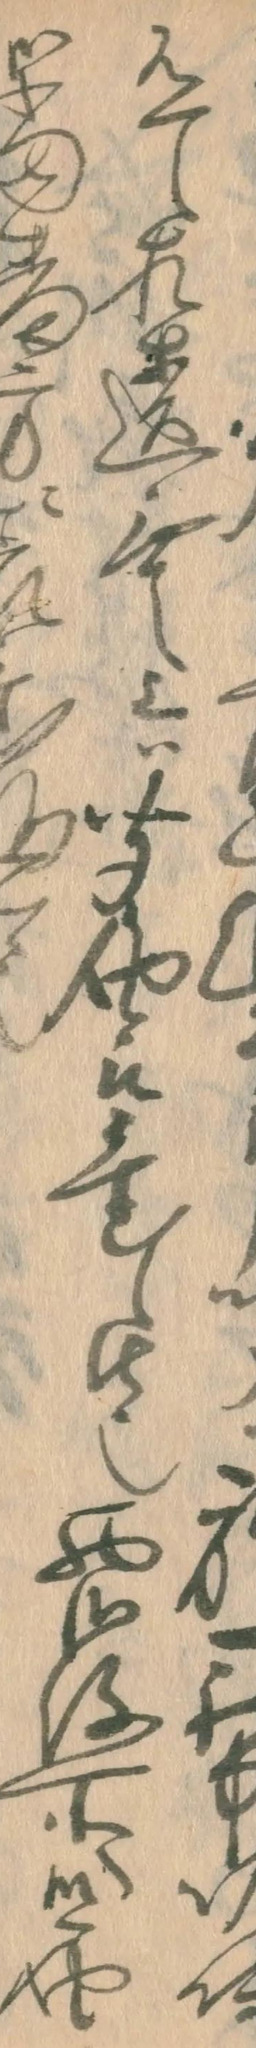有之相違無之上ハ聞届被達候由也西御役所へ御届
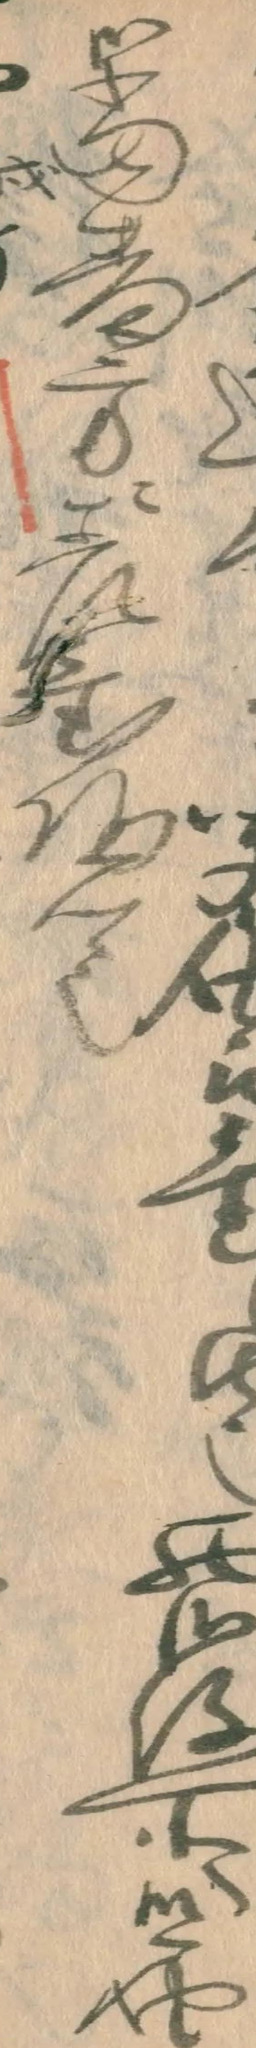御当番方ニ差置帰郷也
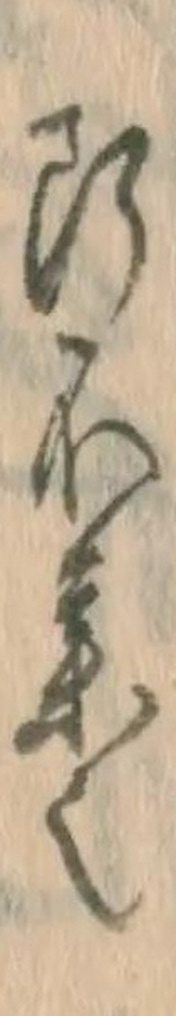頭不参也
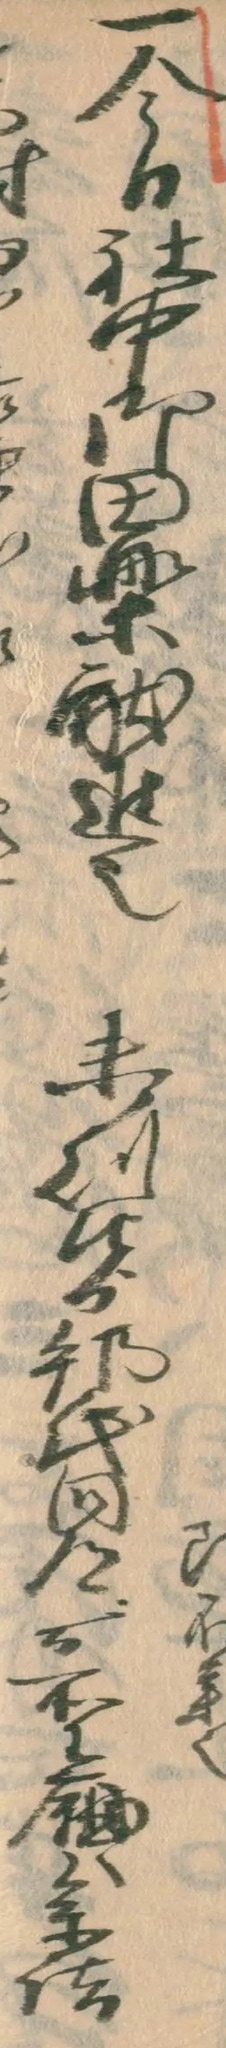一今日社中御田楽献進也未ノ刻頃ゟ邦氏同道ニ而聖庁へ参詣
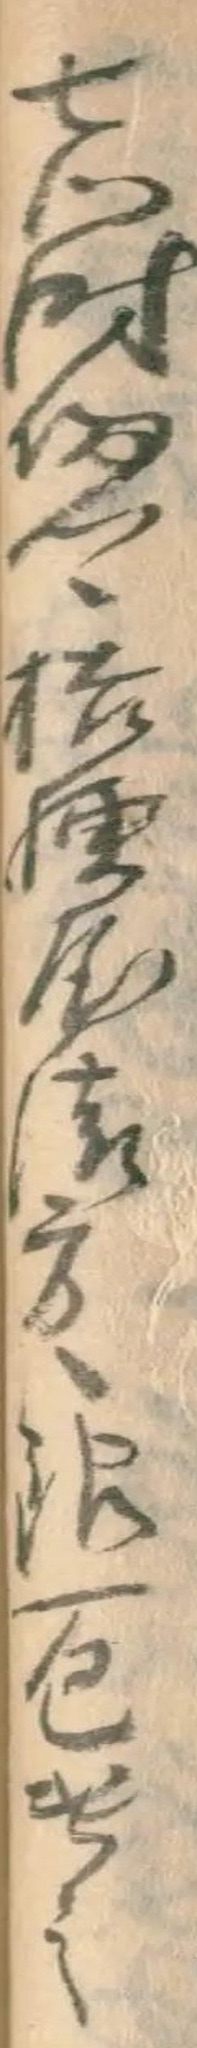七ツ時帰郷桔梗屋俵方へ銀一包遣之
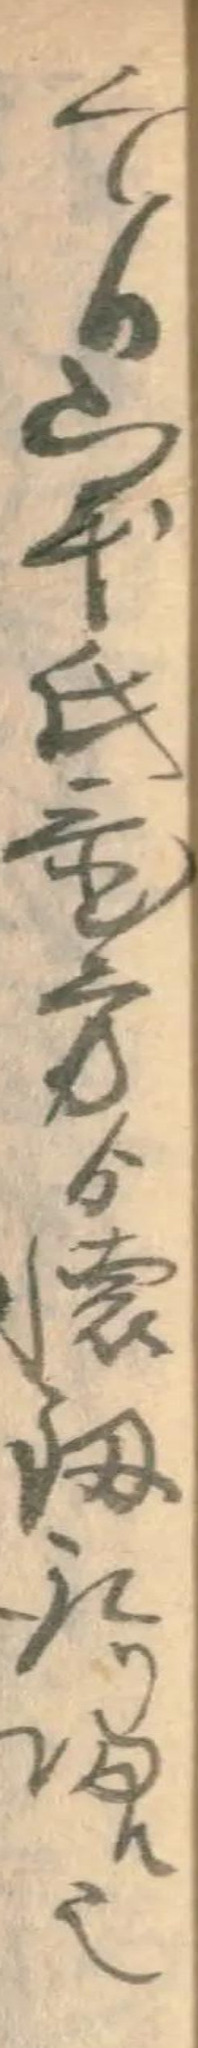今日山本氏置方ゟ懐釼取り帰ル也
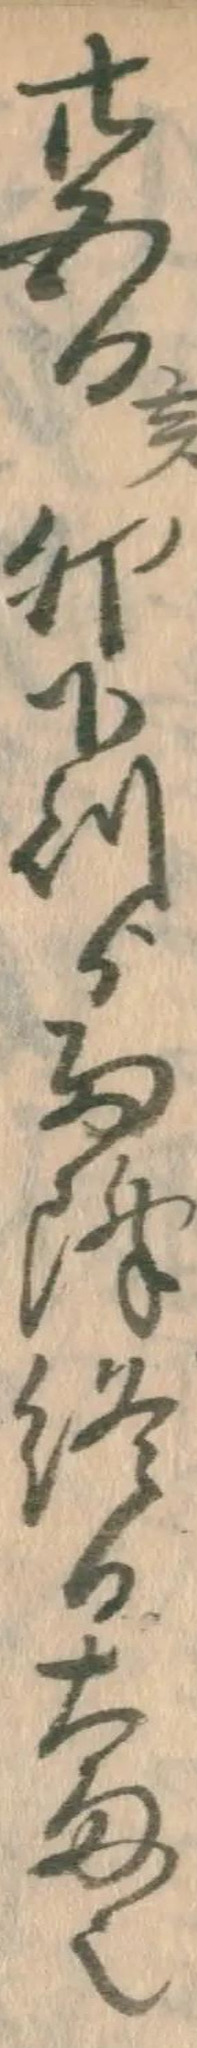廿五日亥卯下刻ゟ雨降終日大雨也
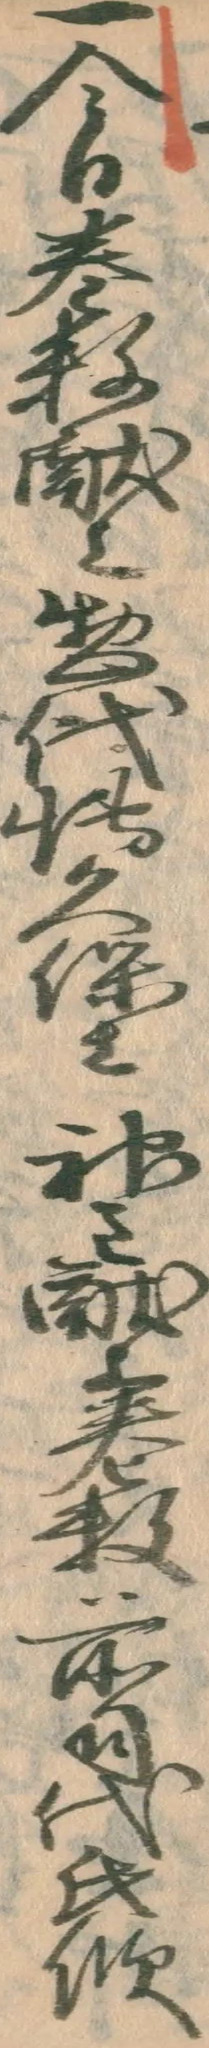一今日巻数献上惣代博久保土神主献上巻数ハ所司代氏領
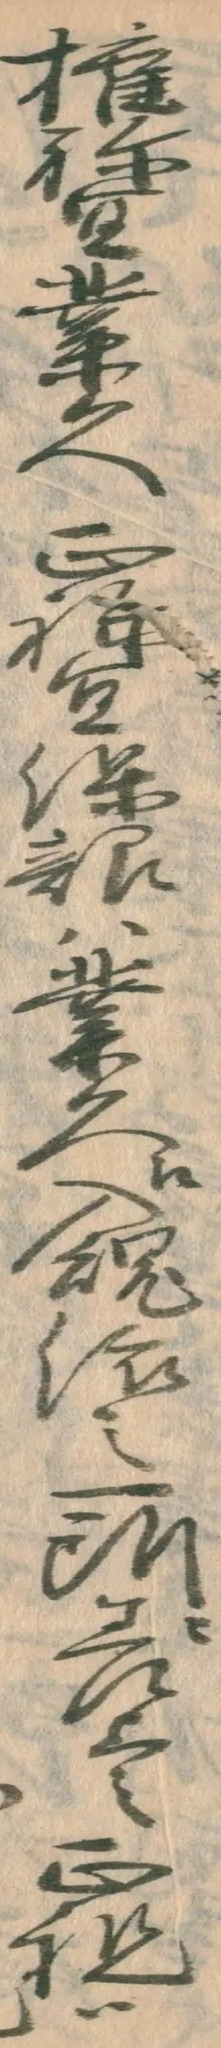権祢宜業久正祢宜保韶ハ業久江入魂依之一所ニ差上之正祝ハ
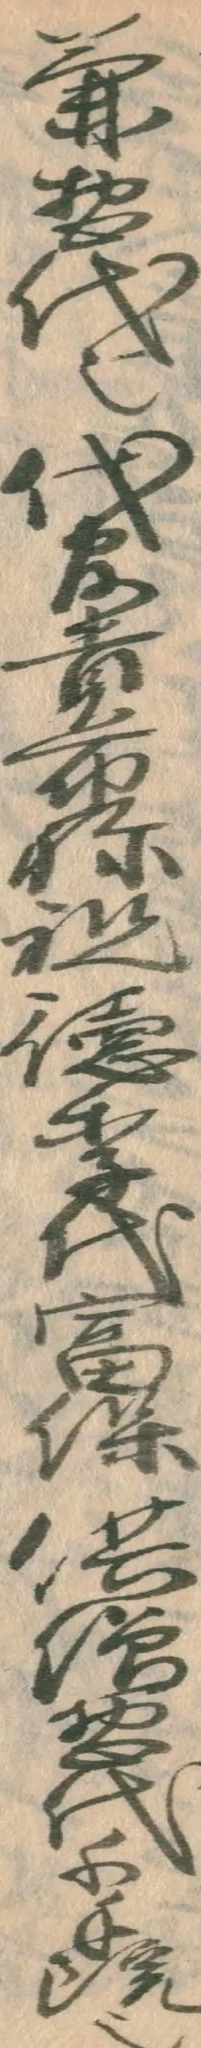兼惣代也代官貴布祢祝徳季代富保供僧惣代千手院也
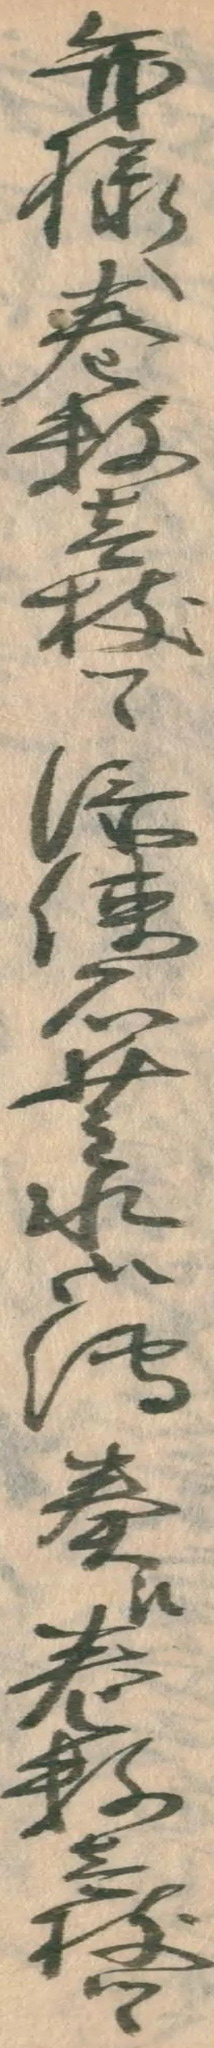弁様へ巻数壱枝ツヽ添使石井主水御伝奏江巻数壱枝ツゝ
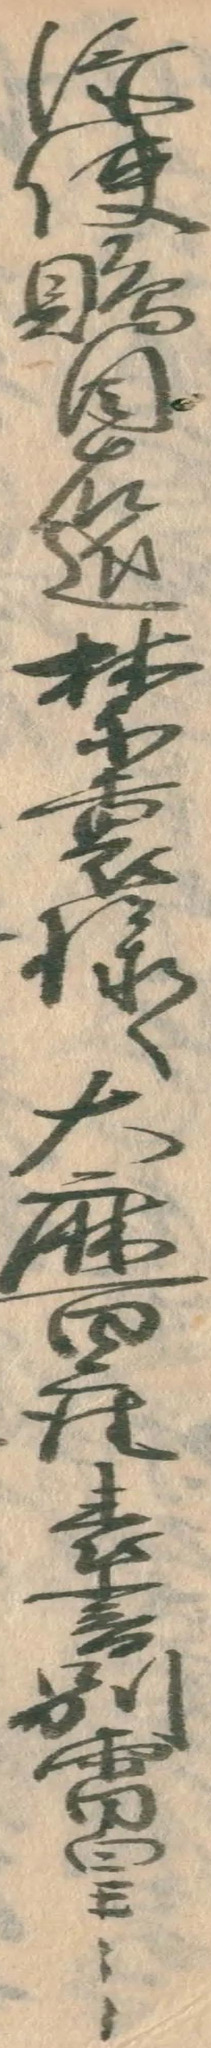添使鵙目右近禁裏様へ大麻百座表書別雷皇云々
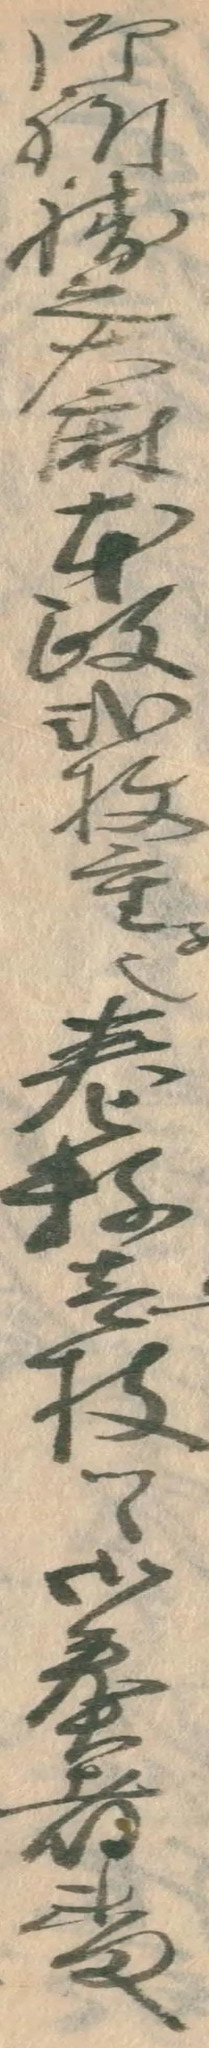御祈祷之大麻本政弐枚重ネ也巻数壱枝ツヽ御奏者番へ
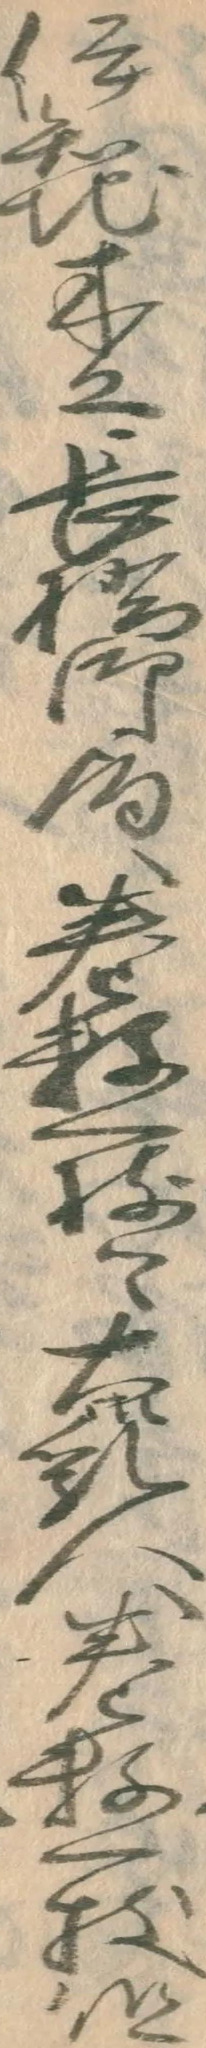伊知地木工長橋御局へ巻数一枝ツヽ大御乳人へ巻殺一枝但
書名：賀茂社記録. 第60冊
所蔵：国立国会図書館 National Diet Library, JAPAN
